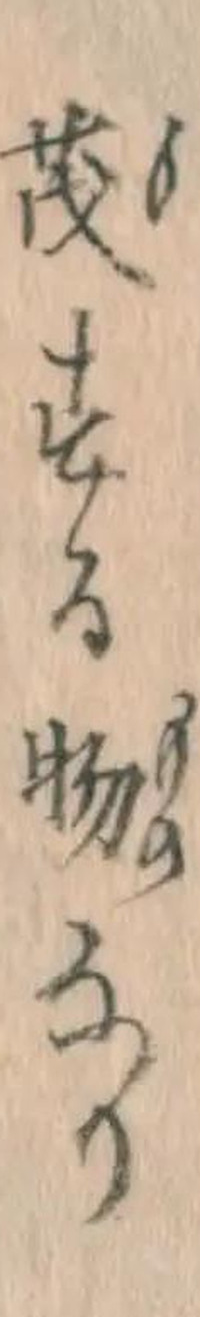茂する物なり

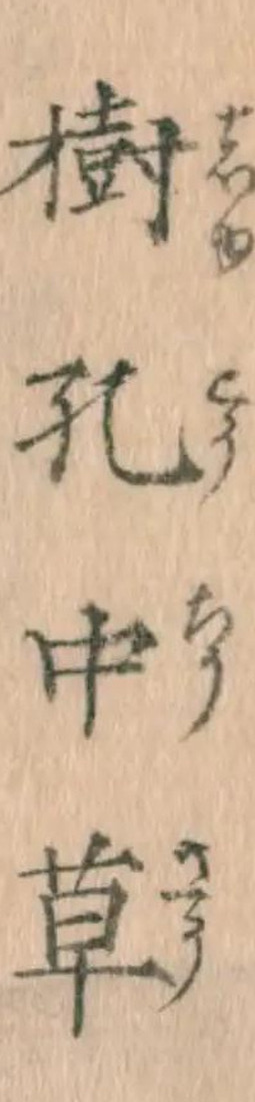樹孔中草
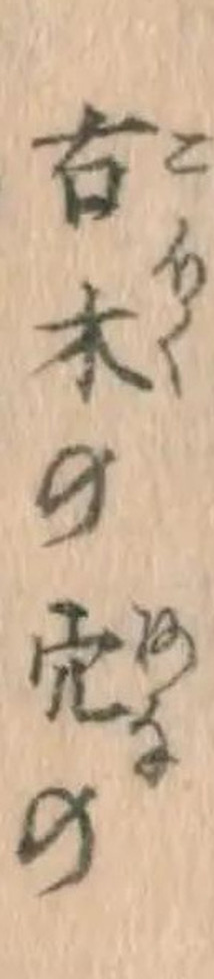古木の穴の
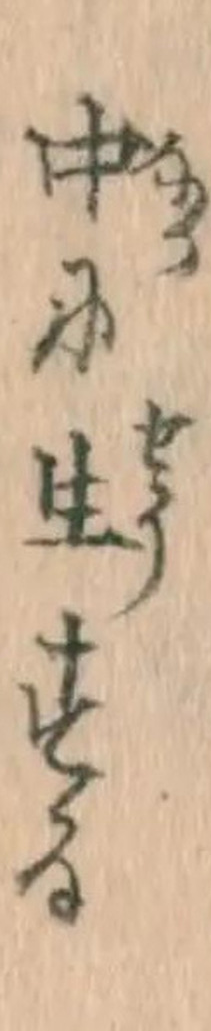中に生する
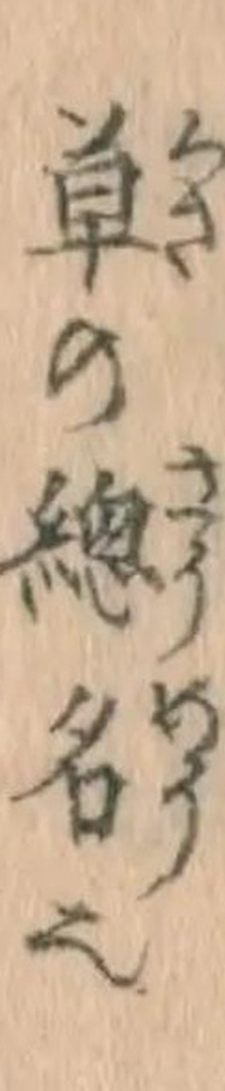草の総名也
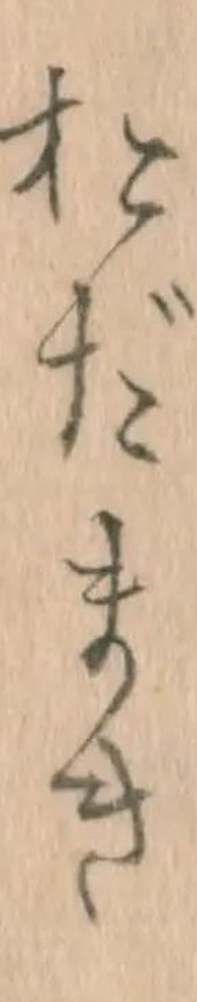おだまき

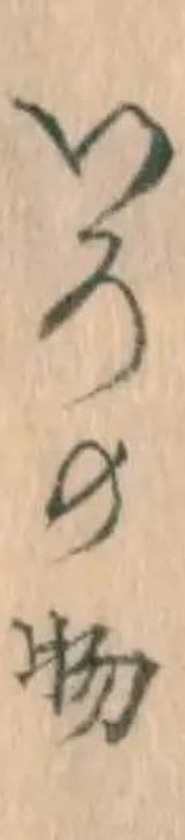いろの物
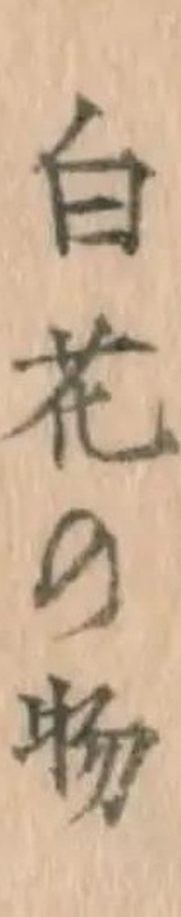白花の物
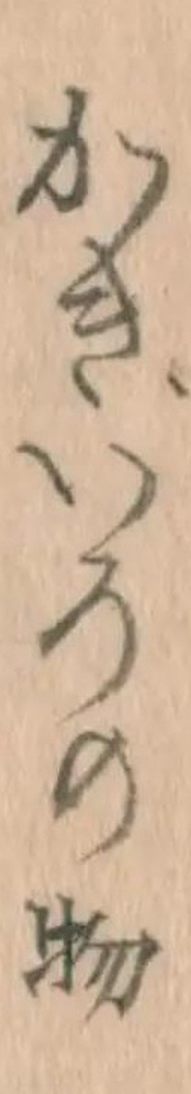かきいろの物
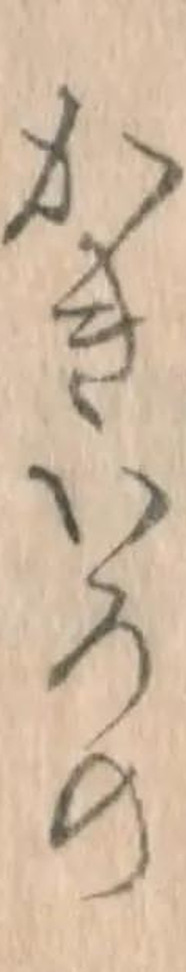かきいろの
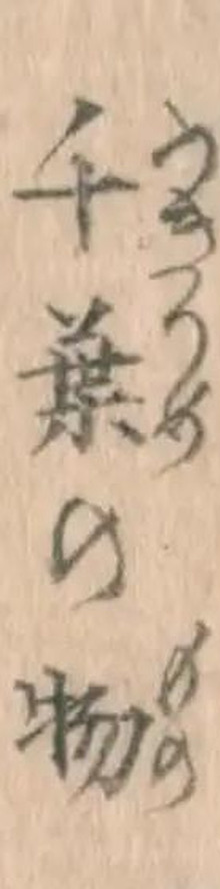千葉の物
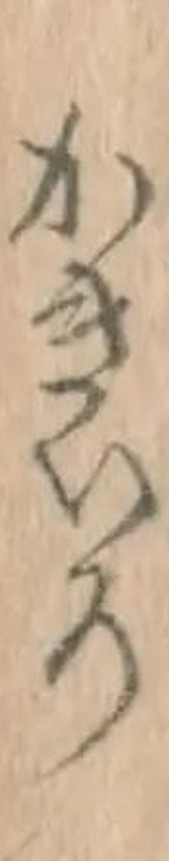かきいろ

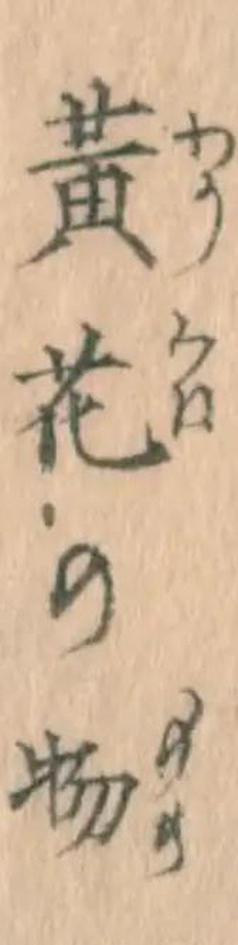黄花の物

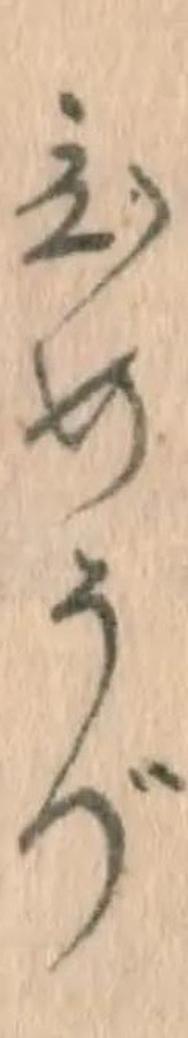ひめうづ
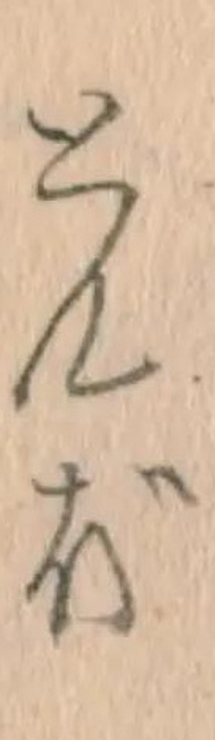とんぼ
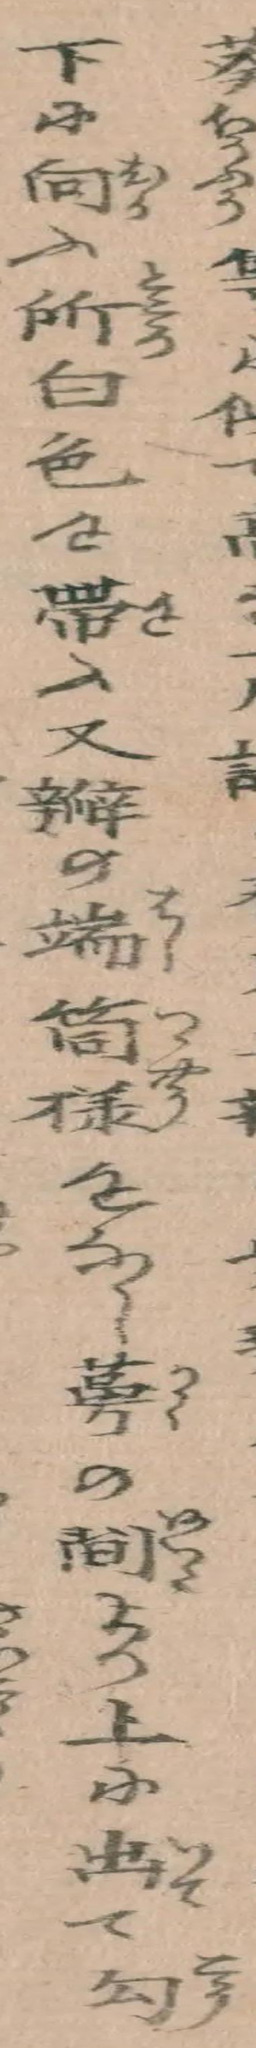下に向ふ所白色を帯ふ又弁の端筒様をなし萼の間より上に出て勾
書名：本草図譜. 巻37-39
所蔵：国立国会図書館 National Diet Library, JAPAN
